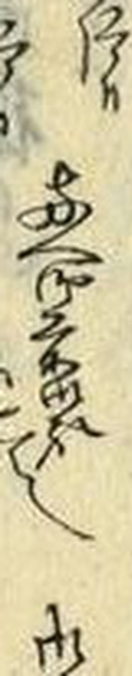両人御前御礼申上之
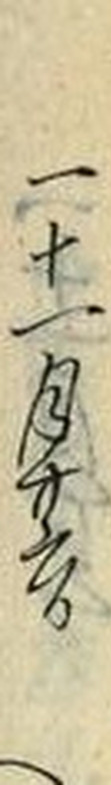一十一月廿六日
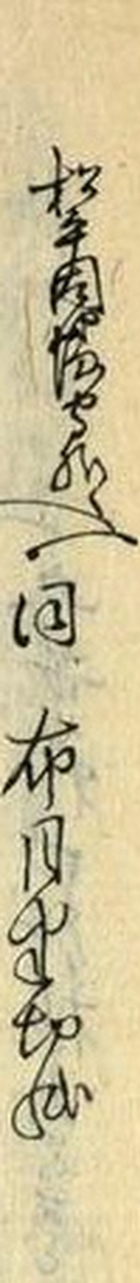松平因幡守様へ同布目半切紙百枚
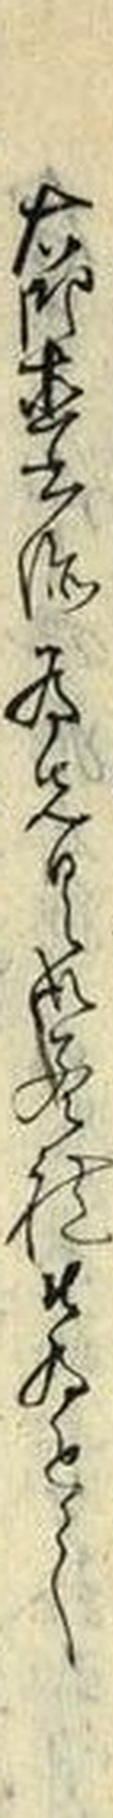右御直書添為先日之御答礼被為進之
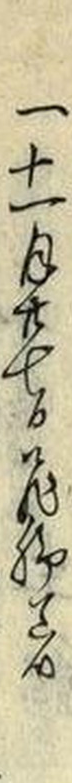一十一月廿七日飛脚着
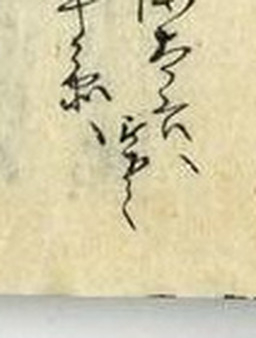江下之
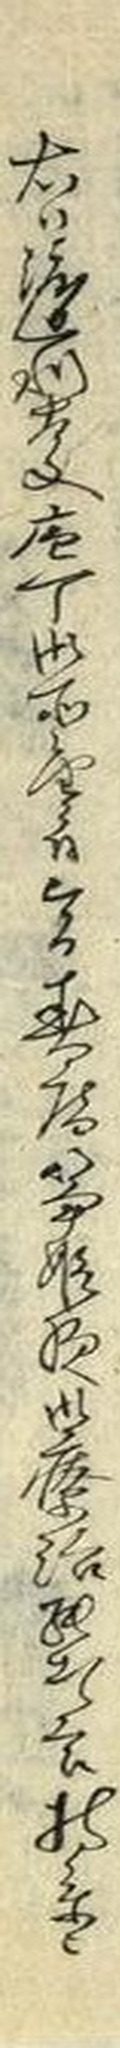右ハ渡辺利太夫包丁御所望ニ付今日春庵箏姫様御療治罷出候節持参被

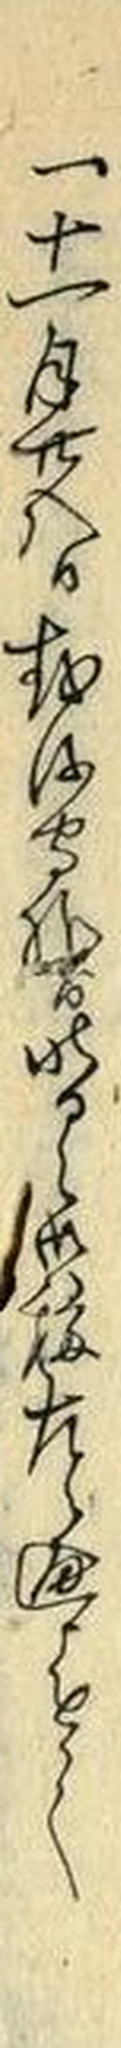一十一月廿八日越後守様ゟ昨日之御移左之通被進之
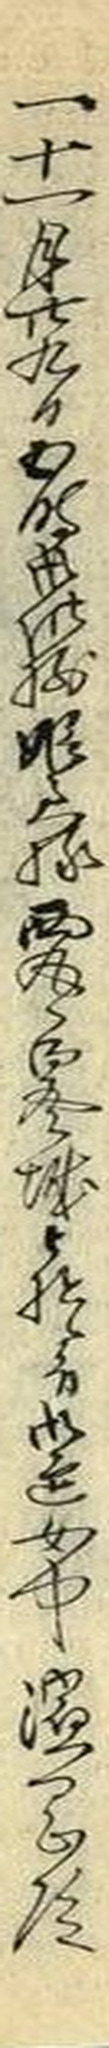一十一月廿九日五時御供揃姫君様西丸へ御登城被遊候ニ付御迎女中浜岡殿
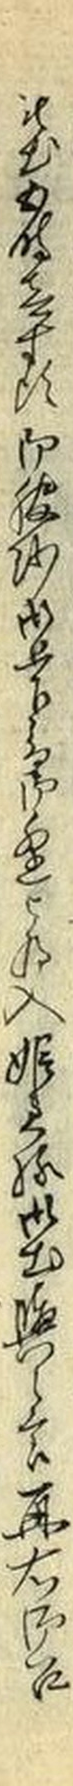被出五時壱寸頃御服紗御上下ニ而御逢被為入姫君様御出輿之節再右御召
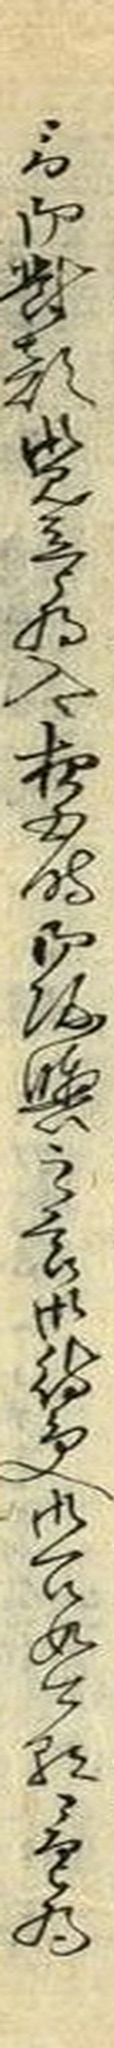ニ而御対顔御見立被為入候夜五時御帰輿之節御待受御召如今朝ニ而被為
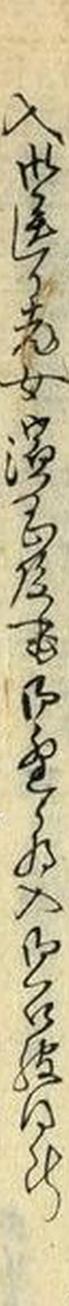入御送り老女浜岡殿へも御逢被為入御召服同断
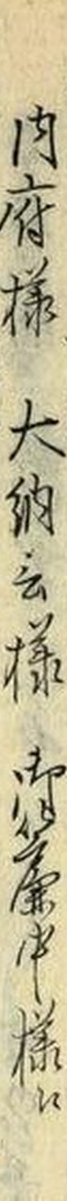内府様大納言様御簾中様江
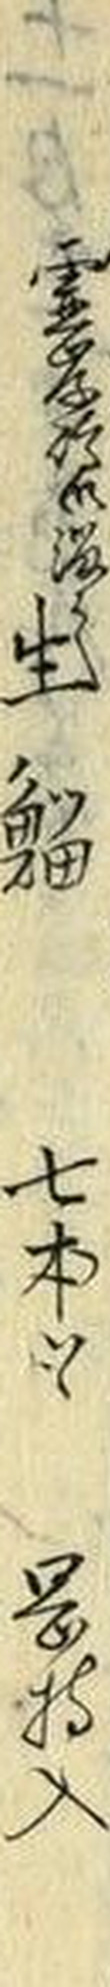霊岸嶋御溜之生鯔七本ツゝ岡持入
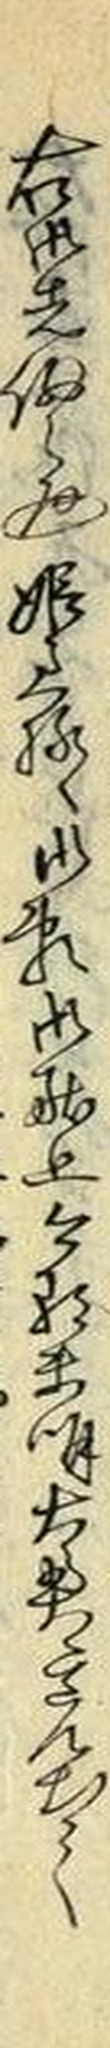右御先例之通姫君様へ御頼御献上今朝未明大奥へ差出之
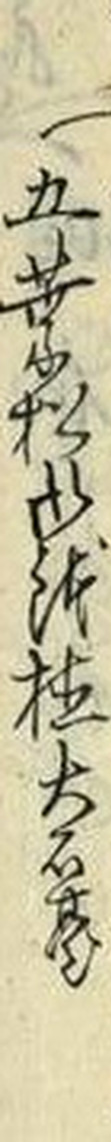五葉松御鉢植大石台
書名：少傅日録抄（斉承付側向頭取日記、在府）
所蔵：福井県文書館 Fukui Prefectural Archives
